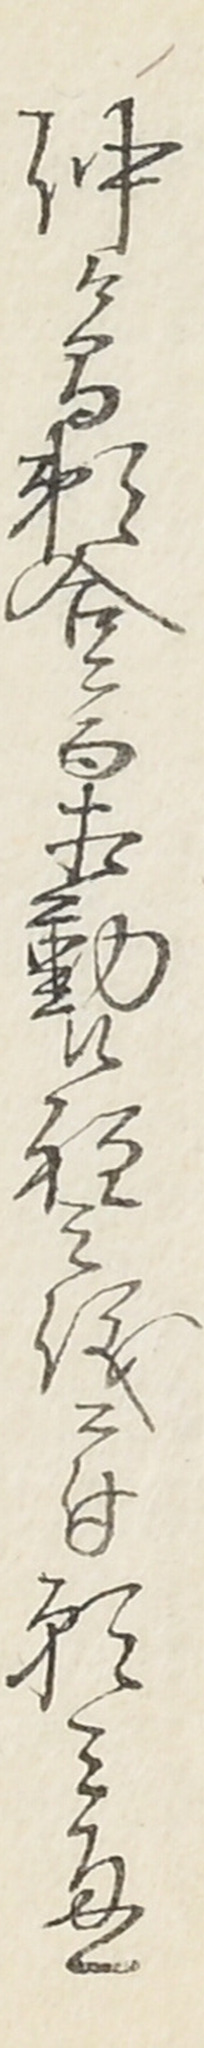仲ヶ間頼合ニ而相勤候程之儀ニ付願之通
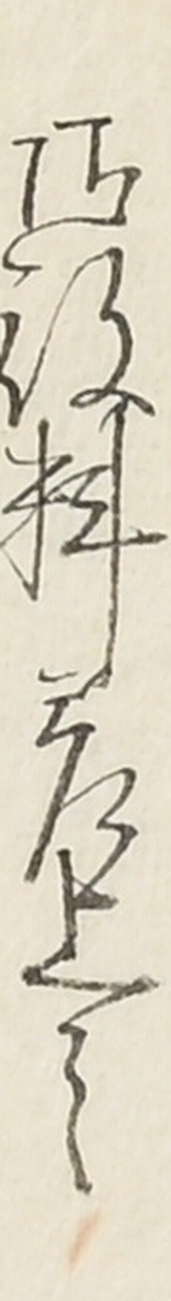御役料差上之
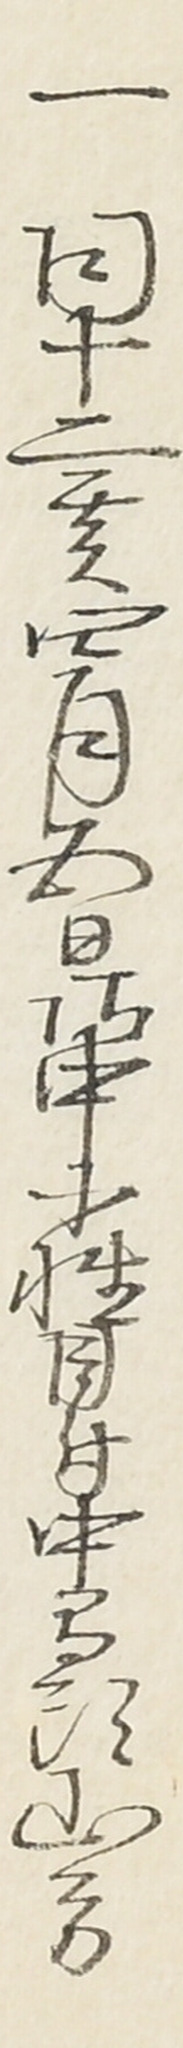一同十二亥四月五日御中小性目付中間頭山方
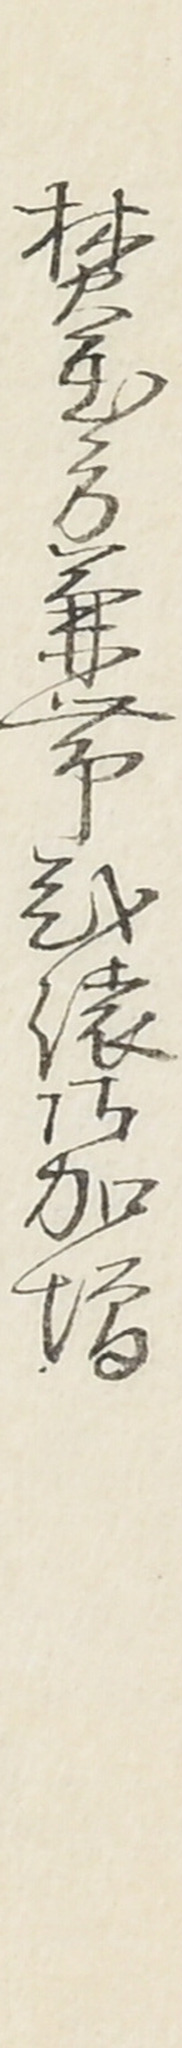焚出方兼帯弐俵御加増
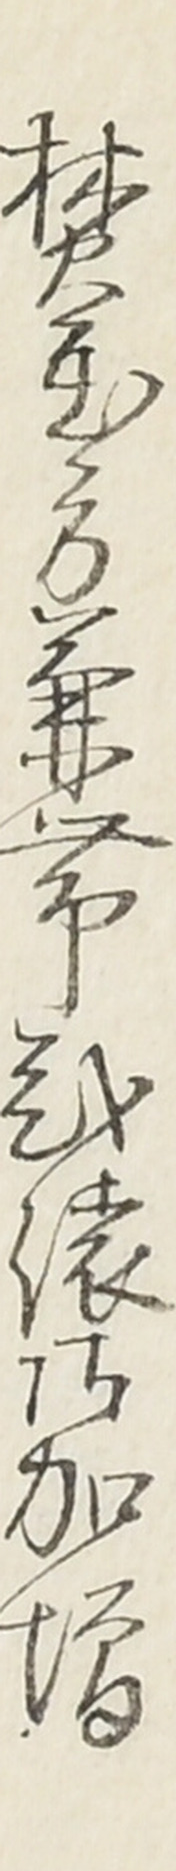焚出方兼帯弐俵御加増
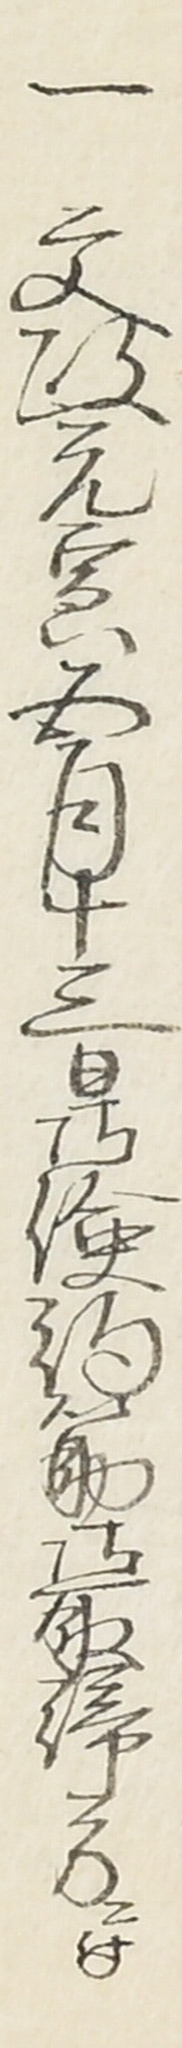一文政元寅五月十三日御倹約筋御取締方ニ付
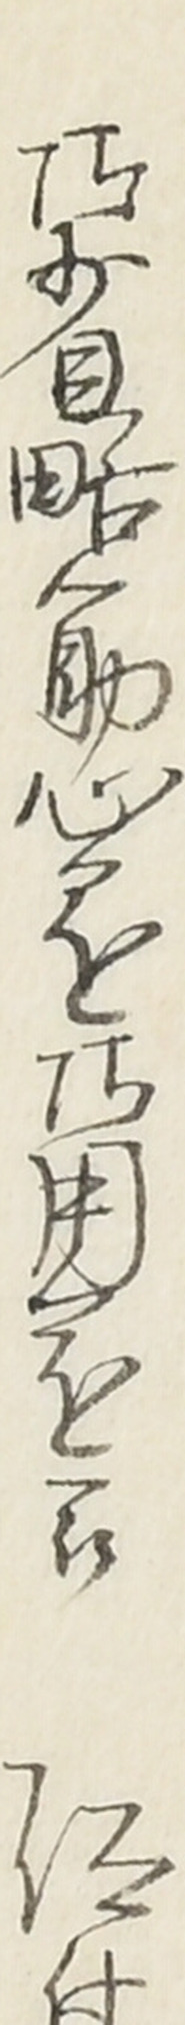御省略筋心懸御用懸被仰付
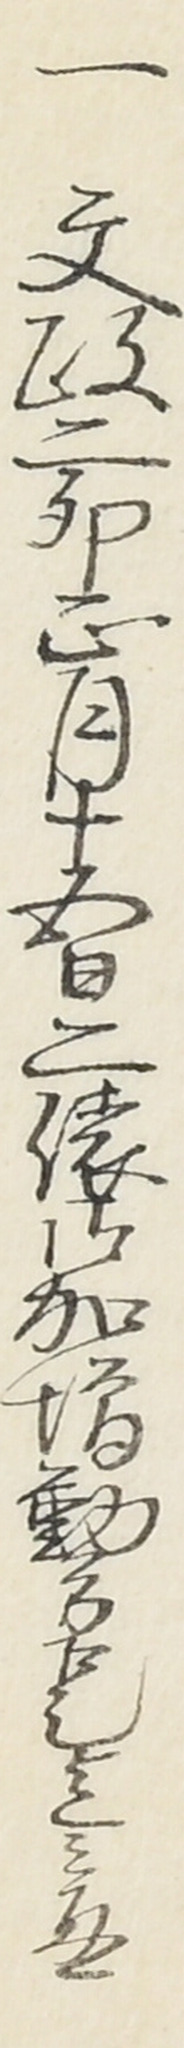一文政二卯正月十五日二俵御加増勤方是迄之通
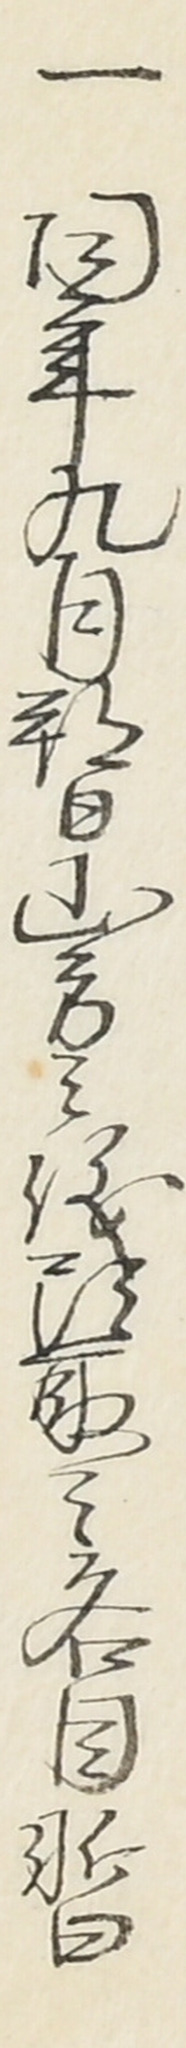一同年九月朔日山方之儀頭取之名目暫
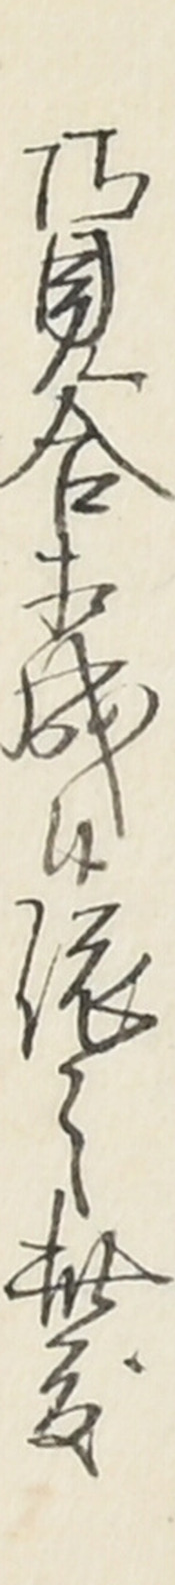御見合相成候依之此度

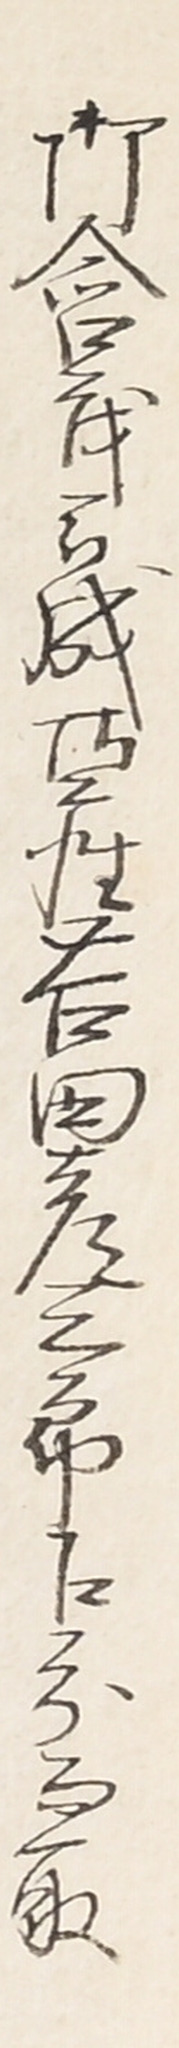御含茂被成御座吉田彦三郎江分而取
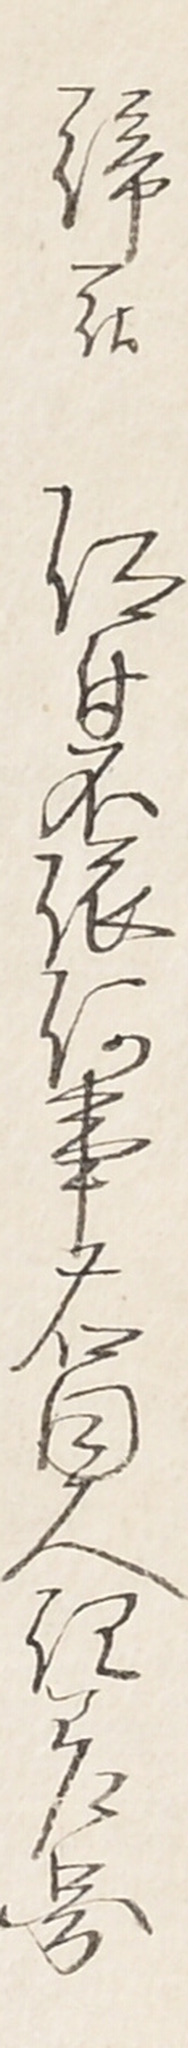締被仰付不依何事右同人任差図
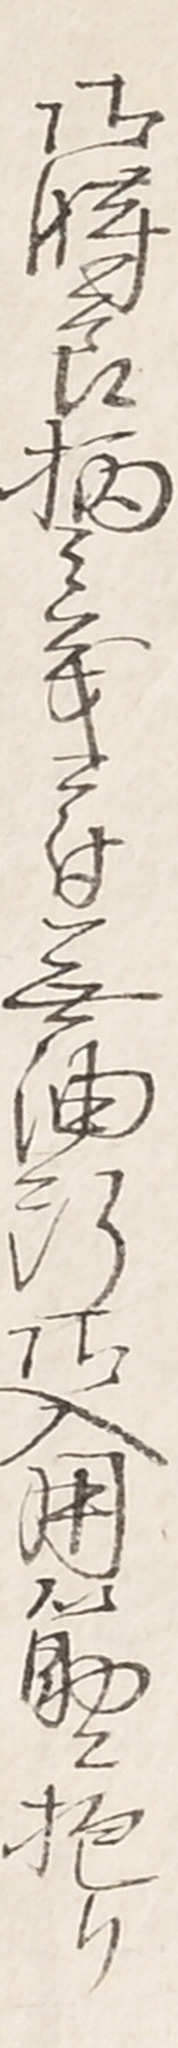御時節柄之義ニ付無油断御入用筋ニ抱り
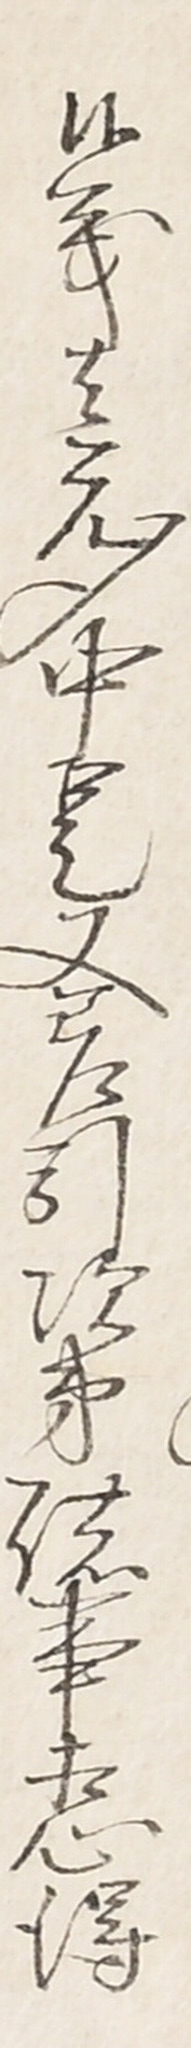候儀者元〆中是又差引次第諸事相心得
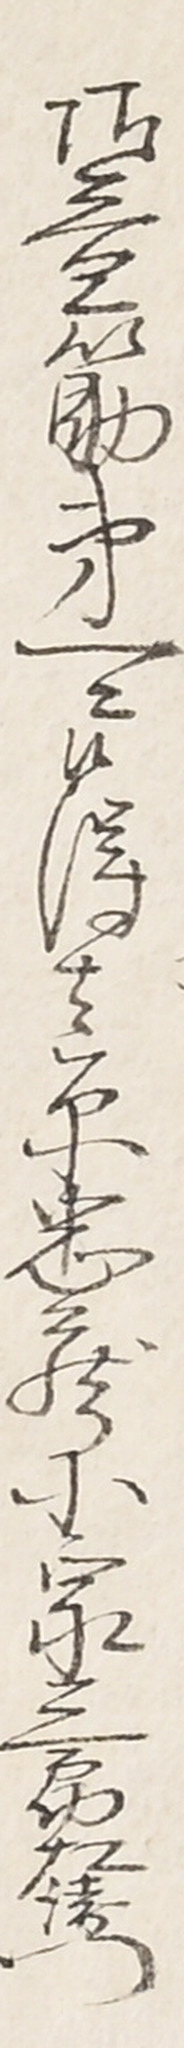御益筋第一ニ候得者原忠蔵小家三郎左衛門
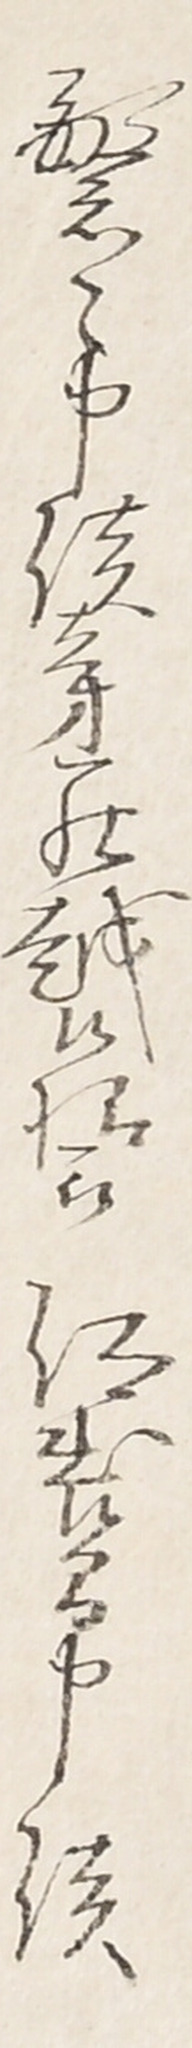繁々申談旁罷越候様被仰出候間申談
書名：無足諸士勤仕録（四）
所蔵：伊那市立高遠町図書館・合同会社AMANE
